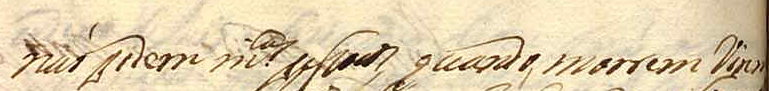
naõ podem m.tas pessoas, quando morrem Vire
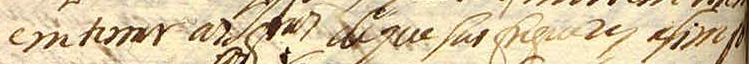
emterrar as Igras de que seus freguezes asim p
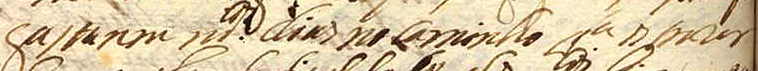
gastarem m.tos dias no caminho p.a os trazer
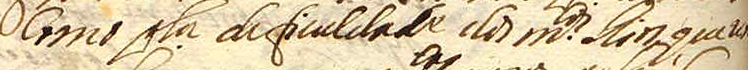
Como pla deficuldade dos m.tos Rios que tem
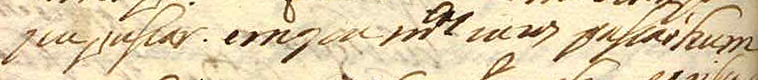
que passar. em que mtas uezes passaõ hum
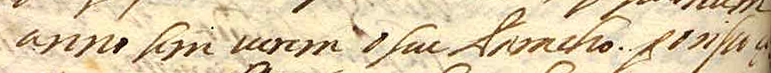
anno sem uerem o seu Parocho: por isso
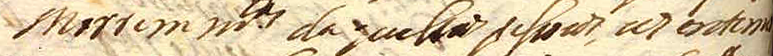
morrem m.tas daquellas pessoas, as enterra
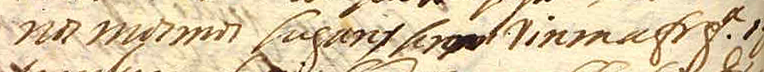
nos mesmos lugares sem virem a freg.a o q̄
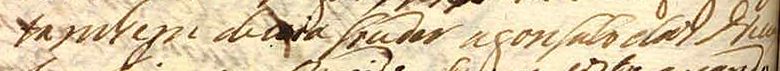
tambem de deuia sondar a gonsalo das Neu
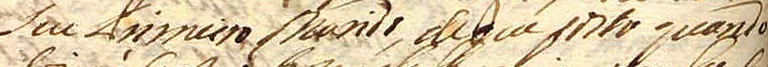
seu Primeiro Marido, de que posto quando
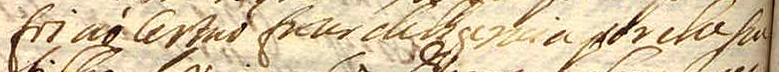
foi ao certaõ fazer delligencia por elle seu
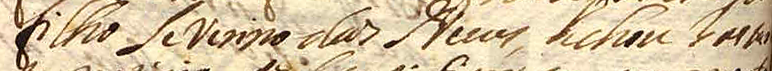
filho Severino das Neues, achou bastan
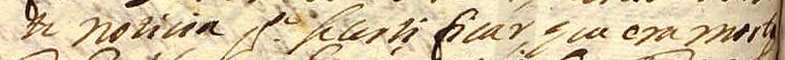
te noticia pa. se certificar que era morto
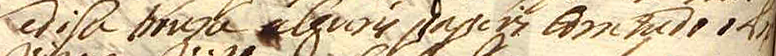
e disse trouxe algun̄s papeis comtudo o Pro
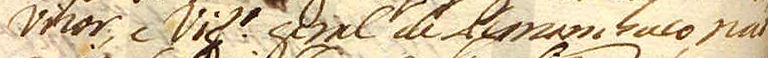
uizor, e Vig.ro geral de Pernambuco, naõ
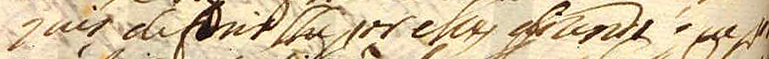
quis deferirlhe por elles dizendo que pr
